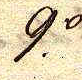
9.
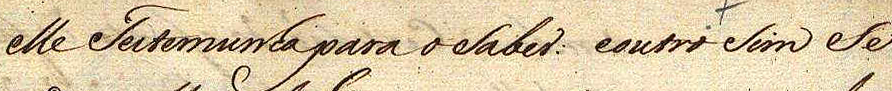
elle Testemunha para o saber: e outrosim Se
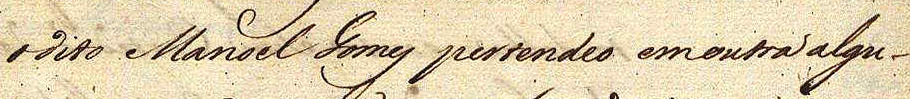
o dito Manoel Gomes pertendeo em outra algu
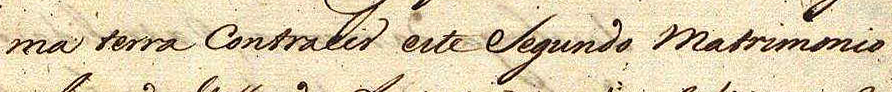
ma terra contrahir este Segundo matrimonio
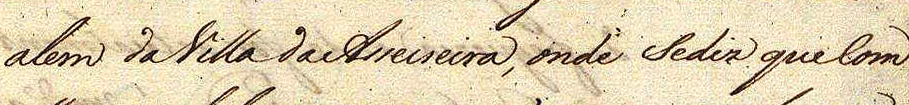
alem da Villa da Asseiseira, onde Se diz que Com
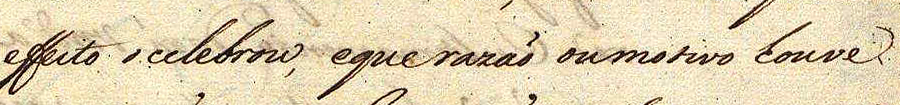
effeito o celebrou, e que razaõ ou motivo houve
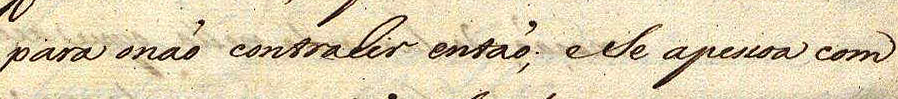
para o naõ contrahir entaõ; e Se a pessoa com
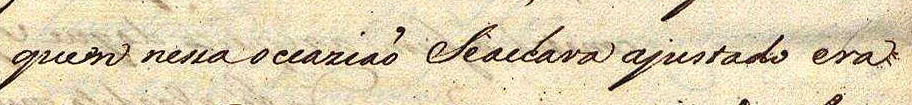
quem nessa occaziaõ Se achava ajustado era
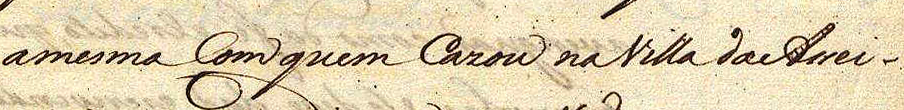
a mesma Com quem Cazou na Villa da Assei
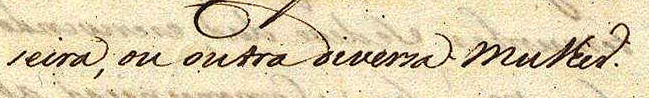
seira, ou outra diversa mulher.
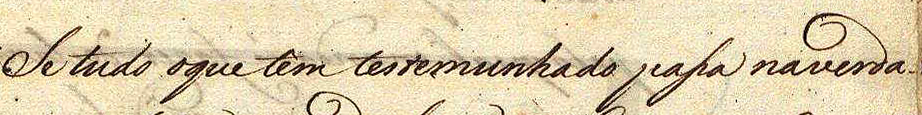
Se tudo o que tem testemunhado passa na verda
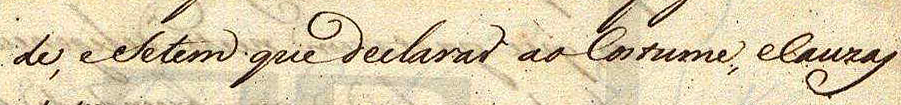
de, e Se tem que declarar ao Costume, e Cauzas
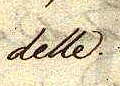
delle.
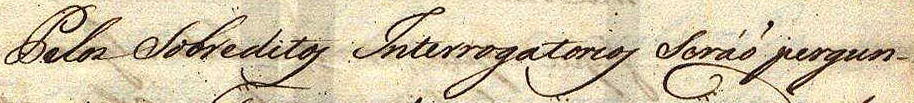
Pelos Sobreditos Interrogatorios seraõ pergun
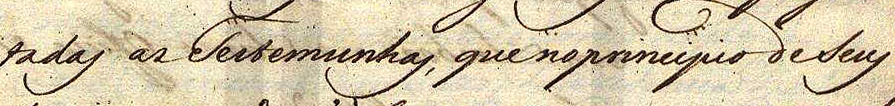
tadas as Testemunhas, que no principio de seus
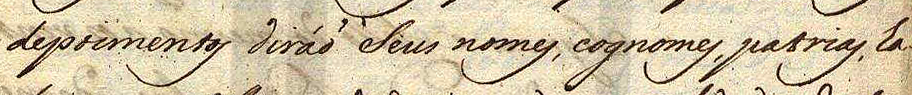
depoimentos dirão Seus nomes, cognomes, patrias, ha
